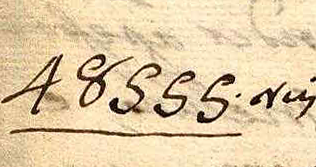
48555. reis
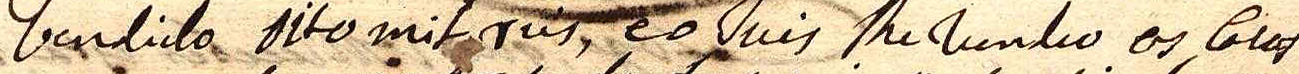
Vendido oito miL reis, e o Iuis lhe vendeo as Cazas
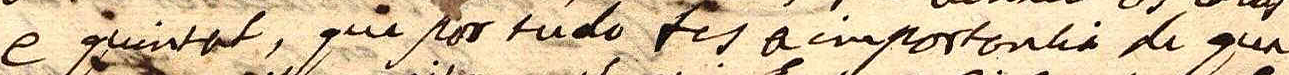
e quintaL, que por tudo fes a importancia de qua
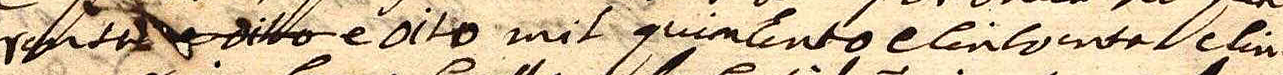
renta e oitto e oito miL quinhento e cincoenta e cin
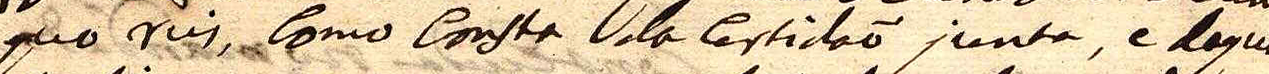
quo reis, Como Consta da Certidaõ junta, e daqui
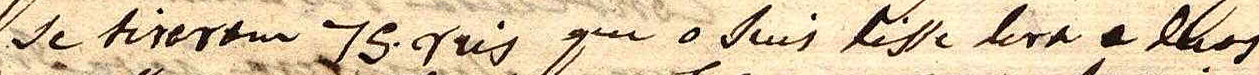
se tiraram 75. reis que o Iuis disse dera a duas
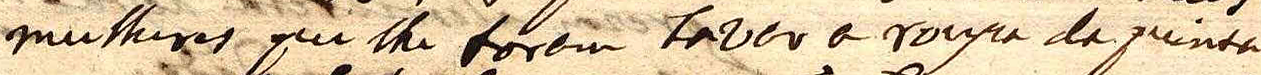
mulheres que lhe foram lavar a roupa da quinta
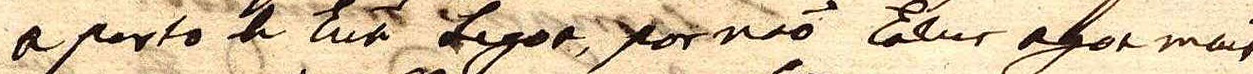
a perto de huā Legoa, por naõ haver agoa mais
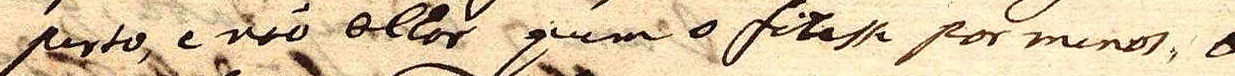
perto, e naõ achar quem o fizesse por menos, o
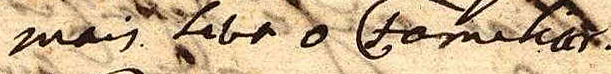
mais Leva o Familiar.
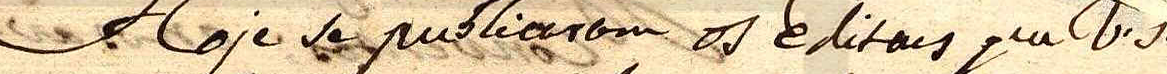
Hoje se publicaram os Editaes que V. s.
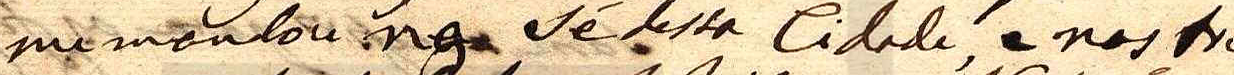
me mandou na Sé desta Cidade, e nas fre
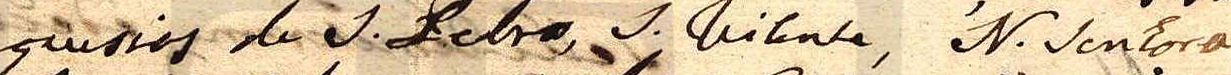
guesias de S. Pedro, S. Vicente, N. Senhora
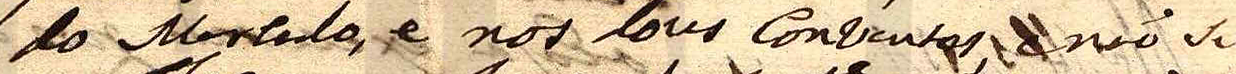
do MerCado, e nos dous Conventos, e naõ se
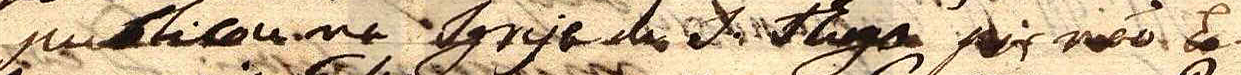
publicou na Igreja de S. Thiago por não ha
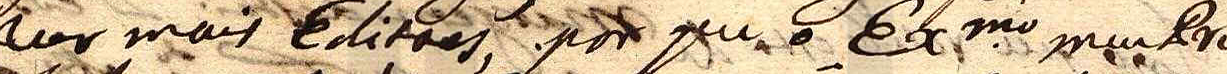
ver mais Editaes, porque o Ex.mo meu Pre
